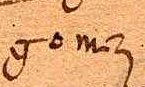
gomez
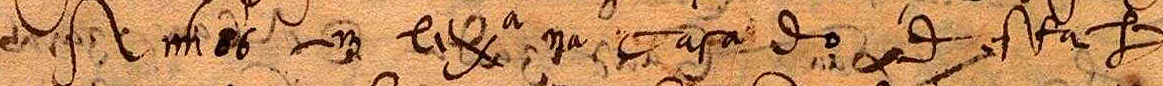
Annos em lixa na casa do despacho
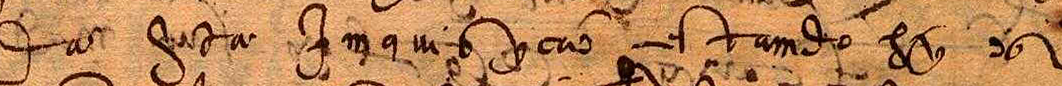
da sāta Jmquisyçaõ estamdo hy os
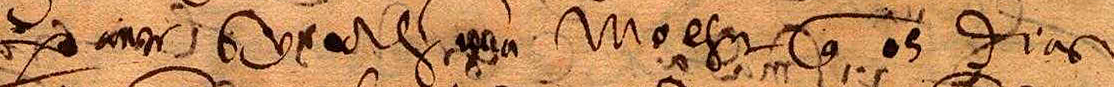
ꝑante sy a hūua molher q̄ os dias
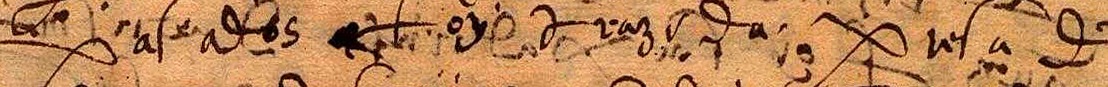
pasados foy trazida presa do
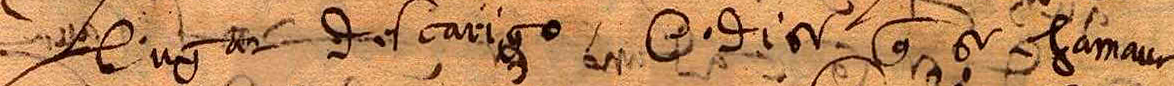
lugar descarigo / e dise q̄ se chamaua
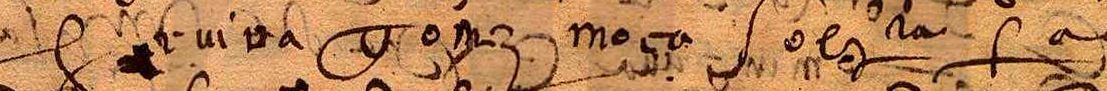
heruira gomez moca soltra fa
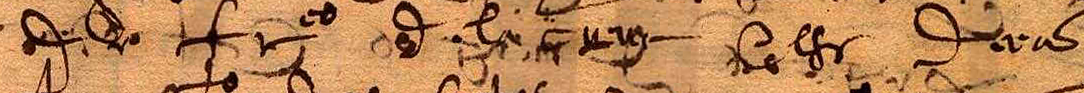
de frco de la cueua e lhe deraõ
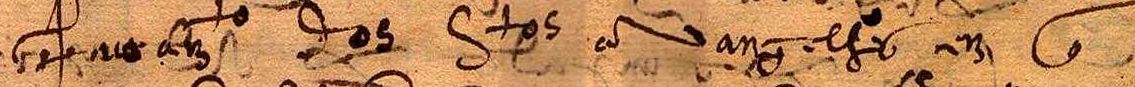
Juramto dos Stos avangelhos em q̄
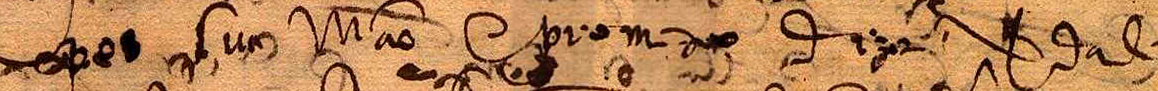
pos sua maõ e prometeo dizer ꝟdade
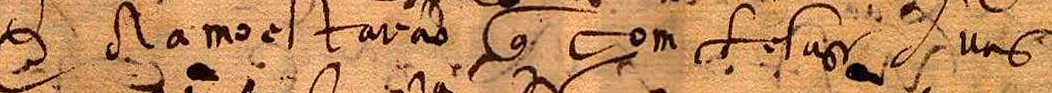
e A amoestaraõ q̄ comfesase suas
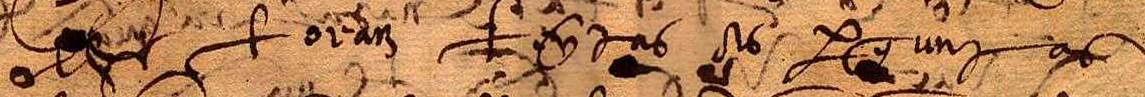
lhe foram feytas As ꝑguntas
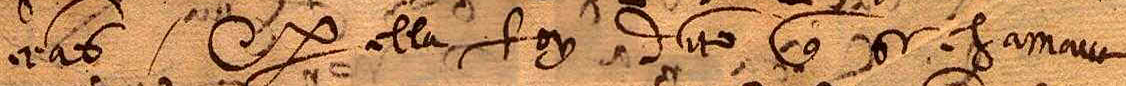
Jerāes / e ꝑ ella foy dīto q̄ se chamaua
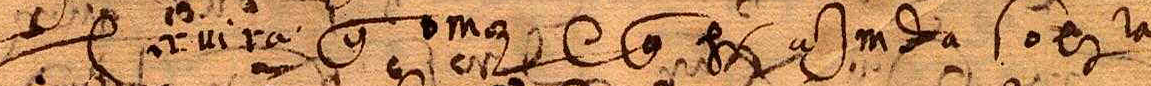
heruira gomez e q̄ he aJmda soltra
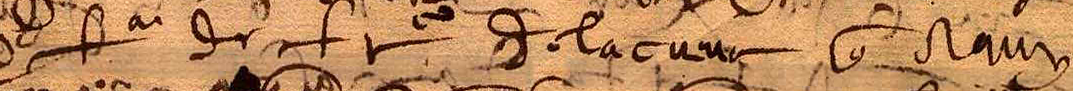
e fa de frco de la cueua q̄ Aquy
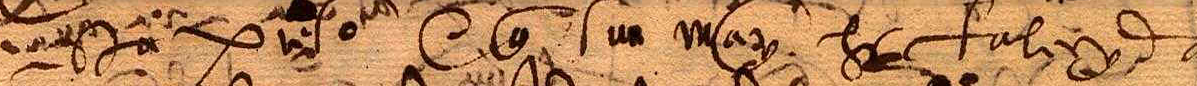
esta preso e q̄ sua may he falecyda
